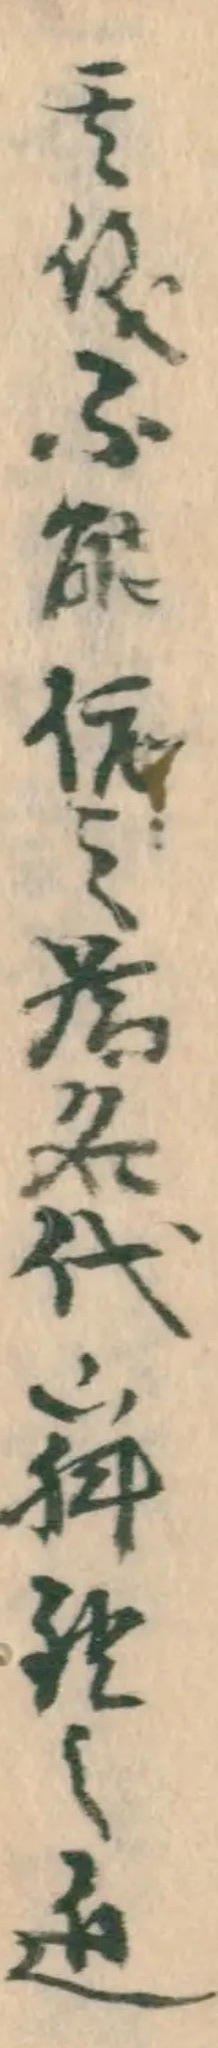其儀不能依之為名代山科鐙之進
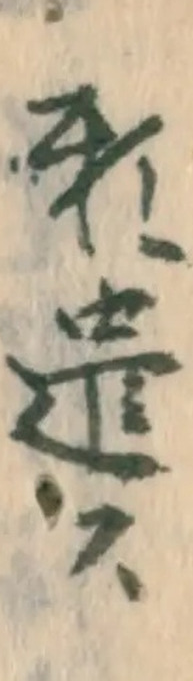頼遣ス
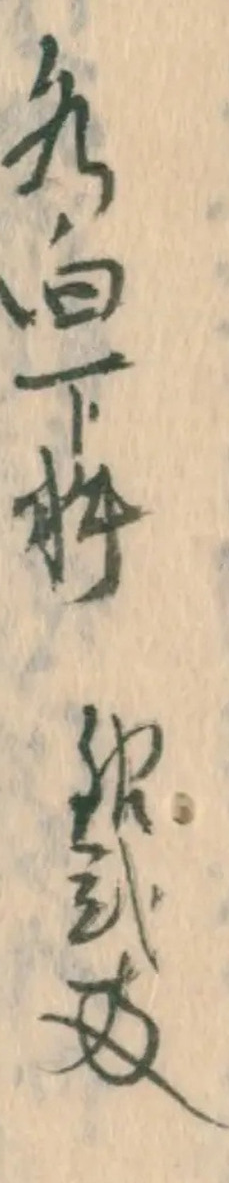水向下料銀弐両
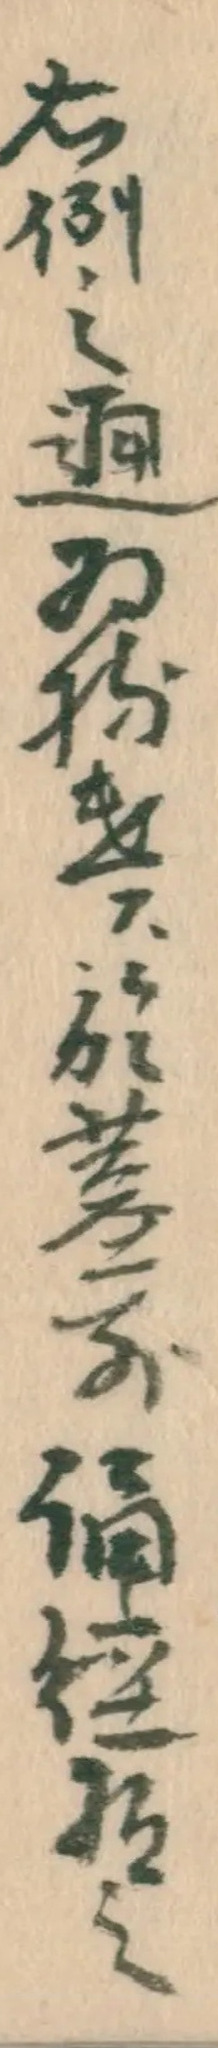右例之通為持遣ス於墓前備経有之
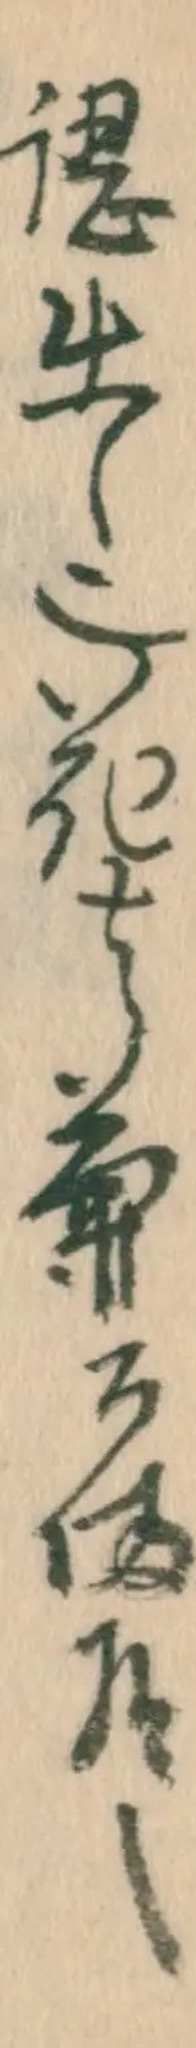認出候也花は兼而備有之
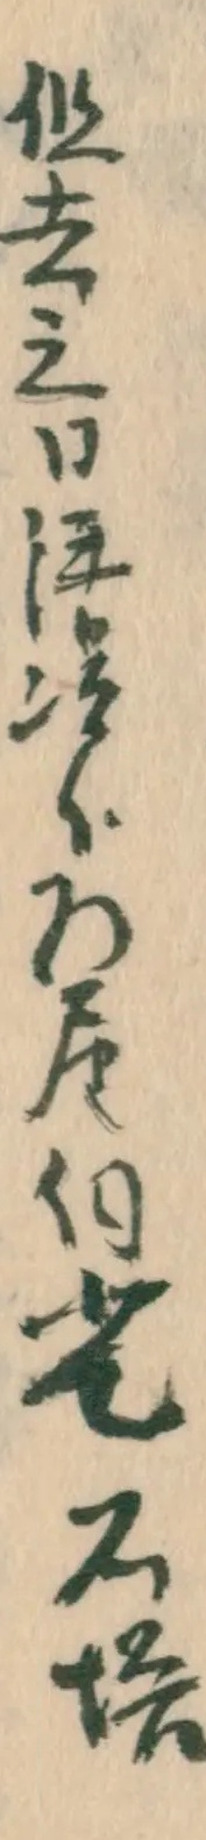但去三日清次郎為届伺登石塔
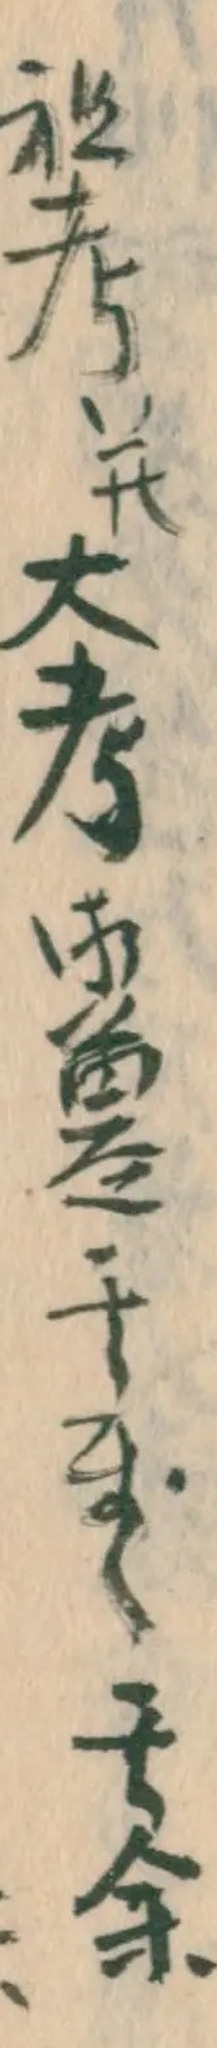祖考并大考御墓其まゝ其余
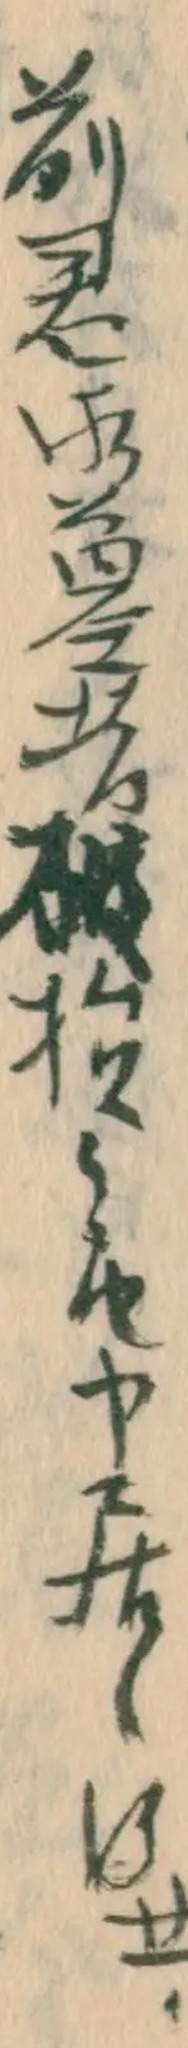前君御墓些破損候由申居候得共
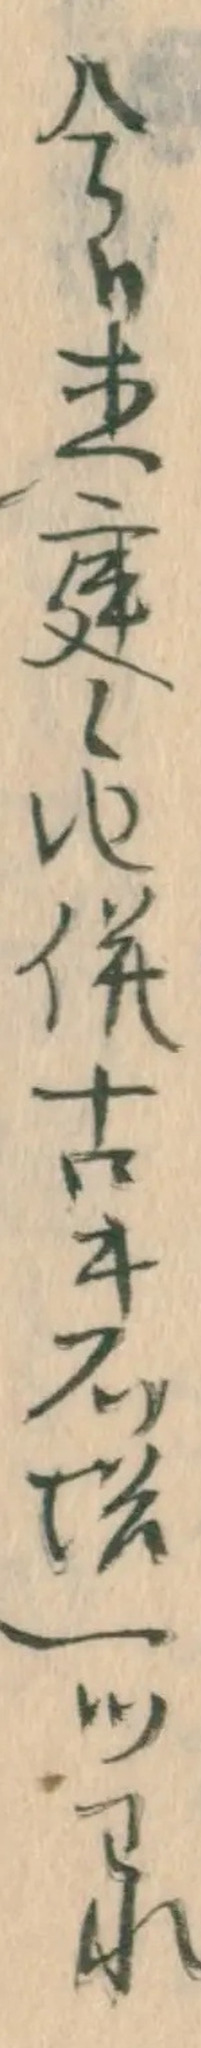今日直建候由併古キ石塔一ツわれ
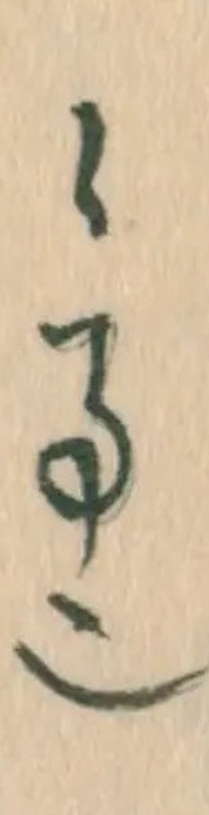候事也
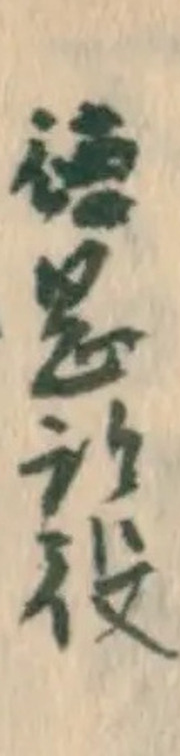徳岡跡役
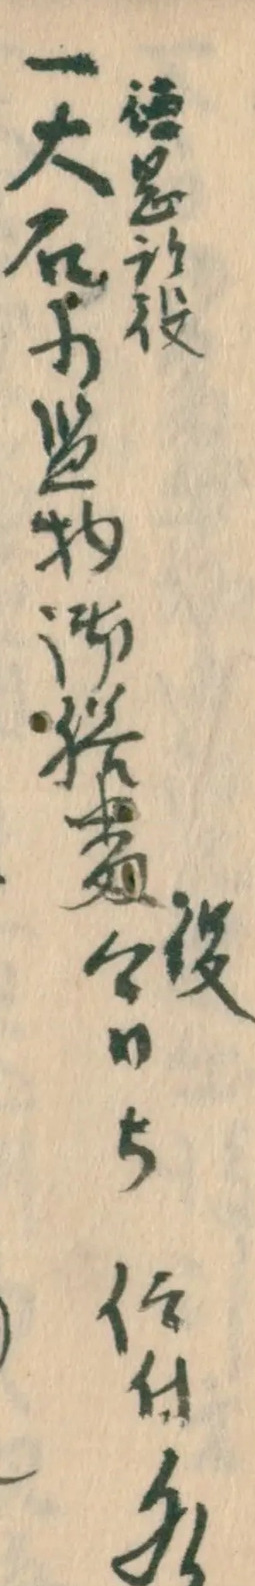一大石少監物御膳番役今日被仰付水口
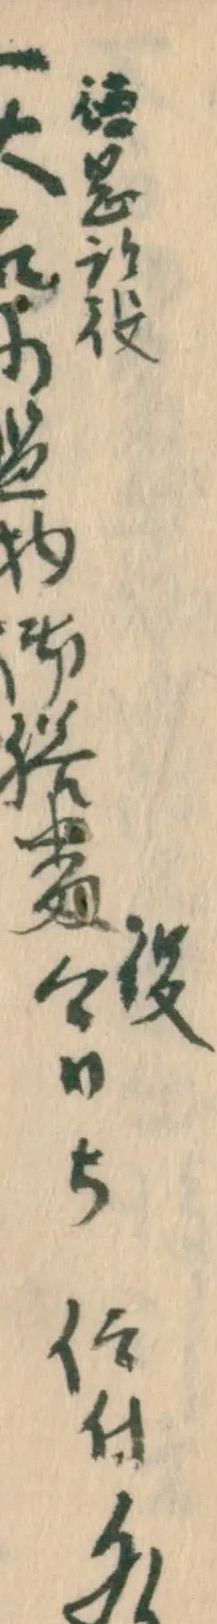一大石少監物御膳番役今日被仰付水口
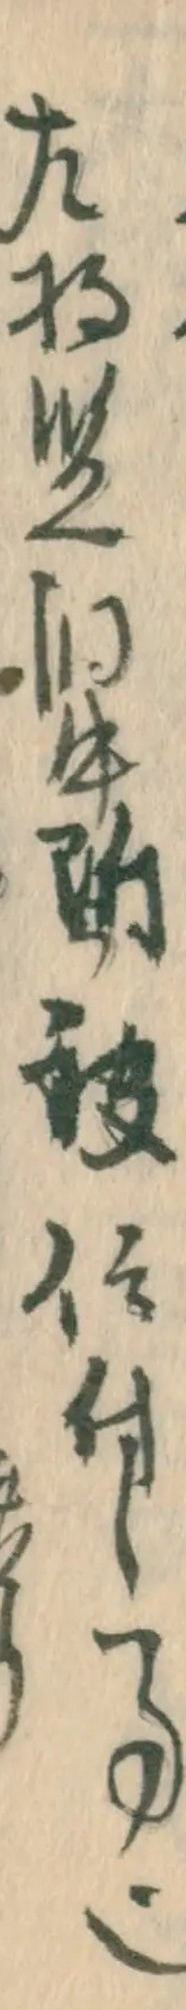左将監洞中附被仰付候事也
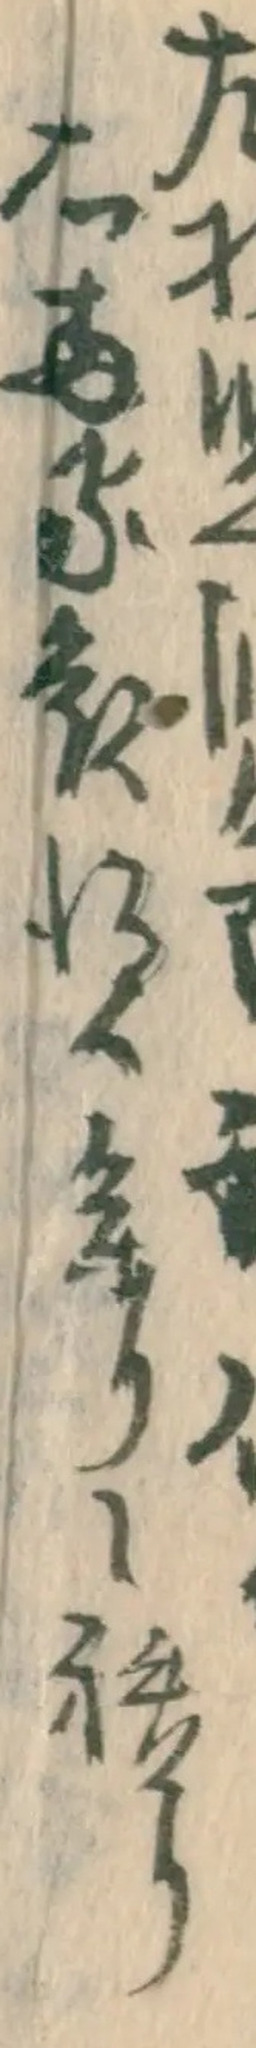右両家歓後日参り候積り
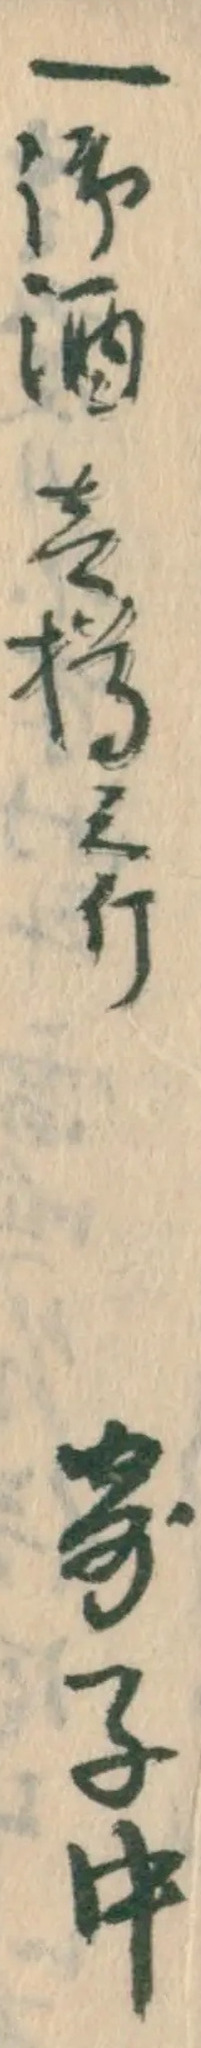一御酒壱樽三斤寄子中
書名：禁裏御所御用日記. [131]
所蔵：国立国会図書館 National Diet Library, JAPAN
